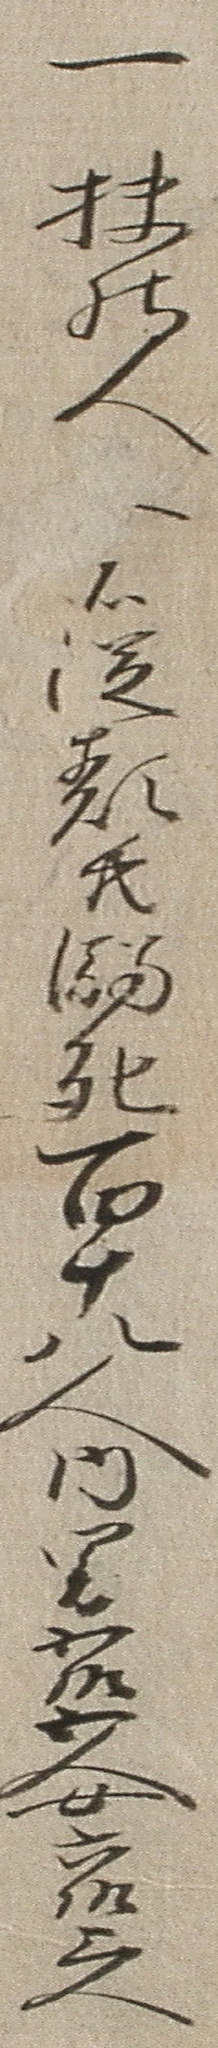一扶持人従類共溺死百十八人内男五拾五人女六拾三人
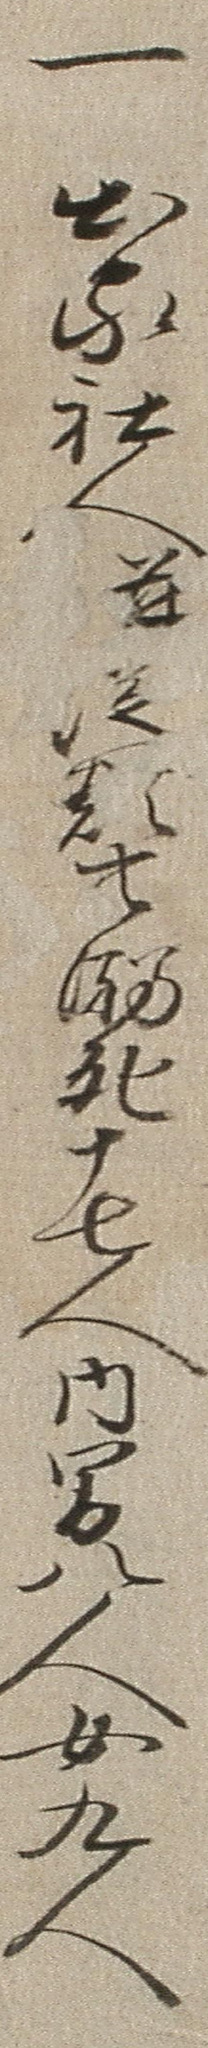一出家社人并従類共溺死一七人内男八人女九人
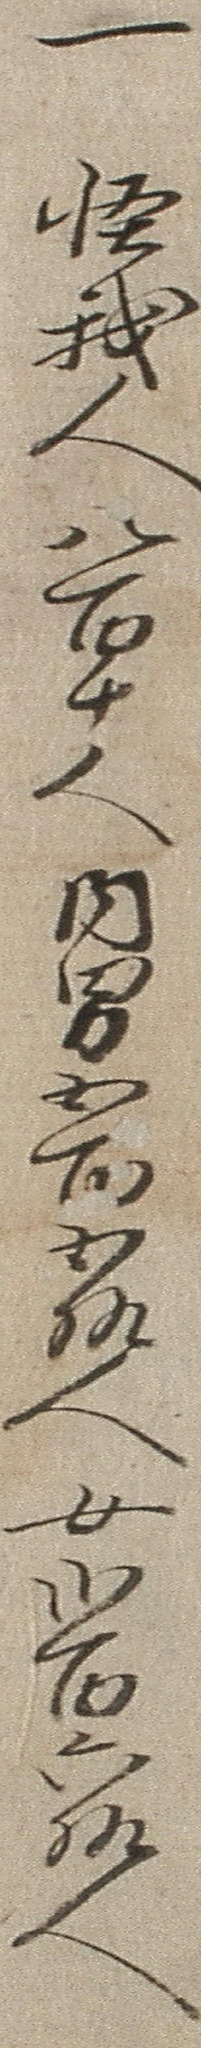一怪我人八百十人内男五百五拾人女弐百六拾人
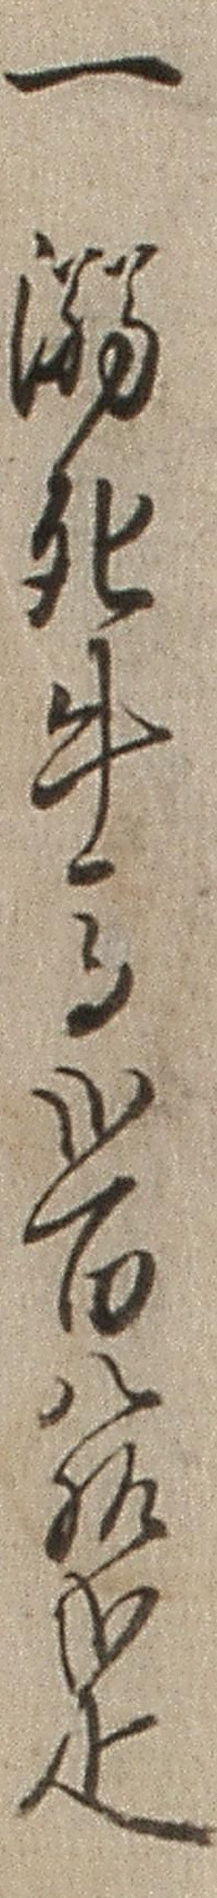一溺死牛馬弐百八拾弐疋
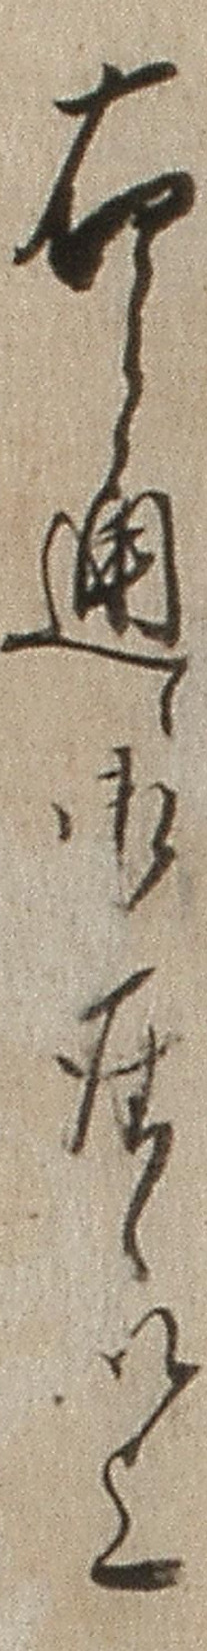右之通に御座候以上
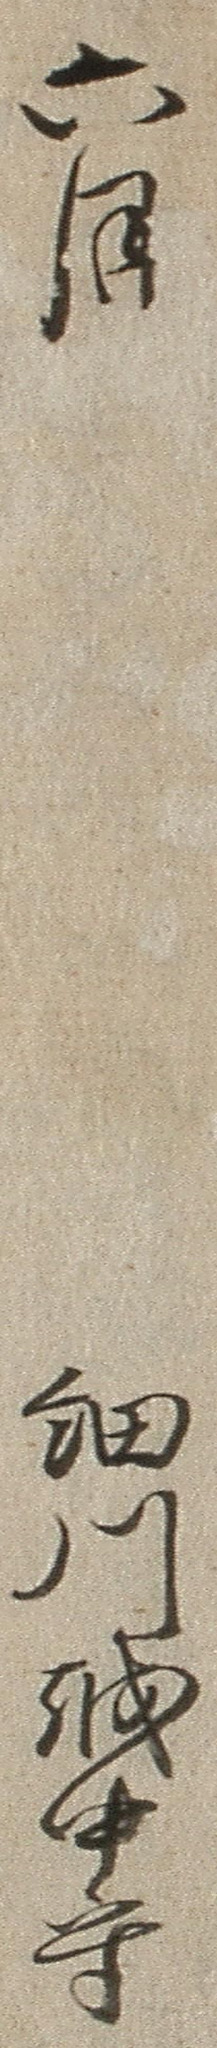六月細川越中守
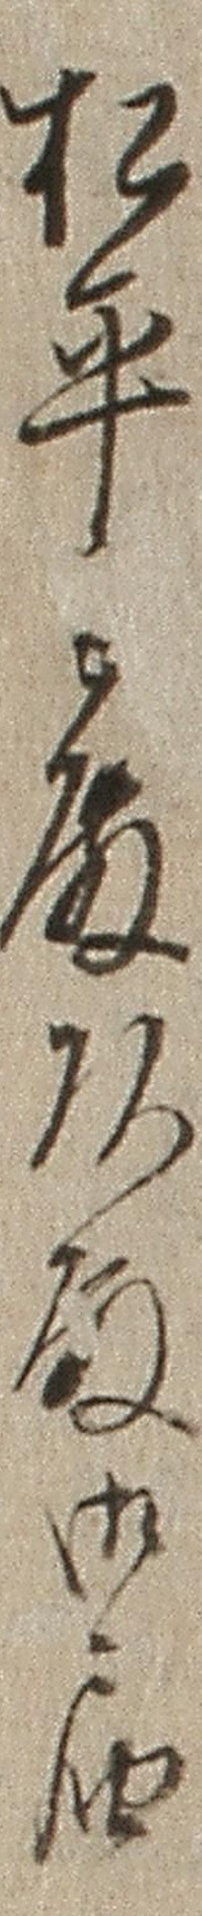松平主殿頭殿御届
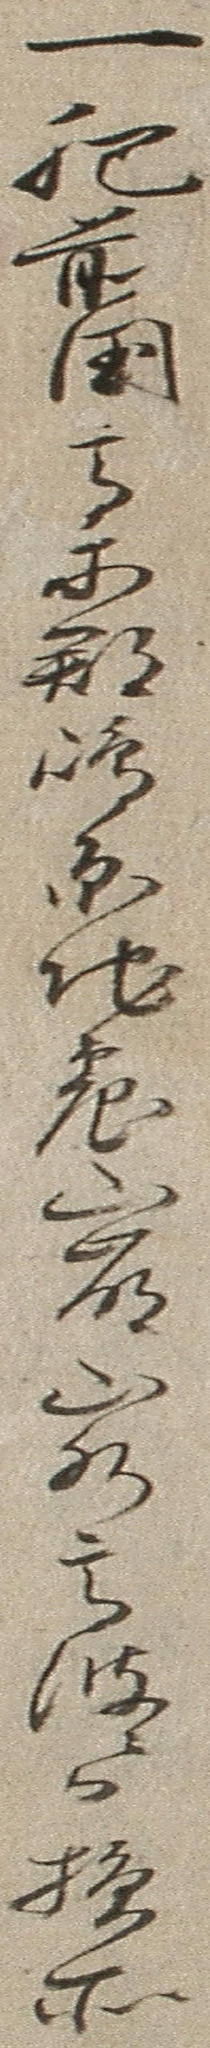一肥前国高木郡嶋原地震山崩山水高波に而損所
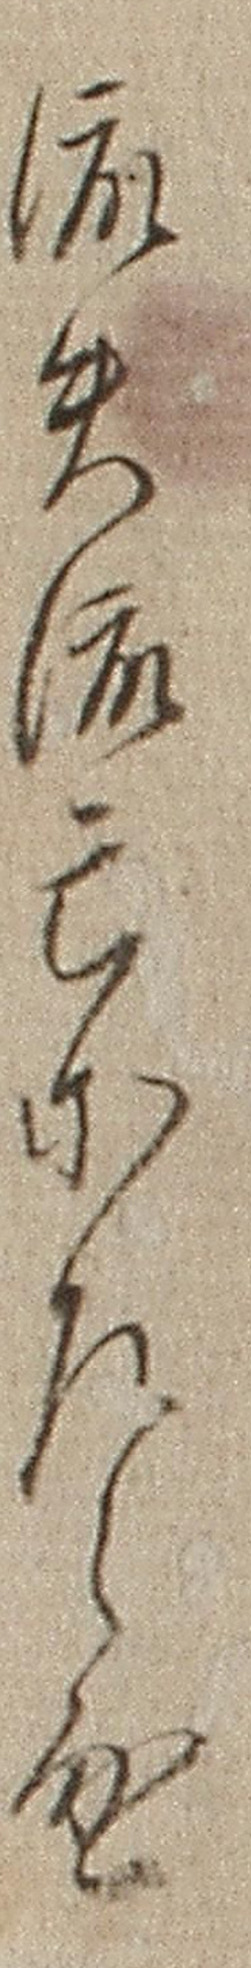流失流亡等左之通
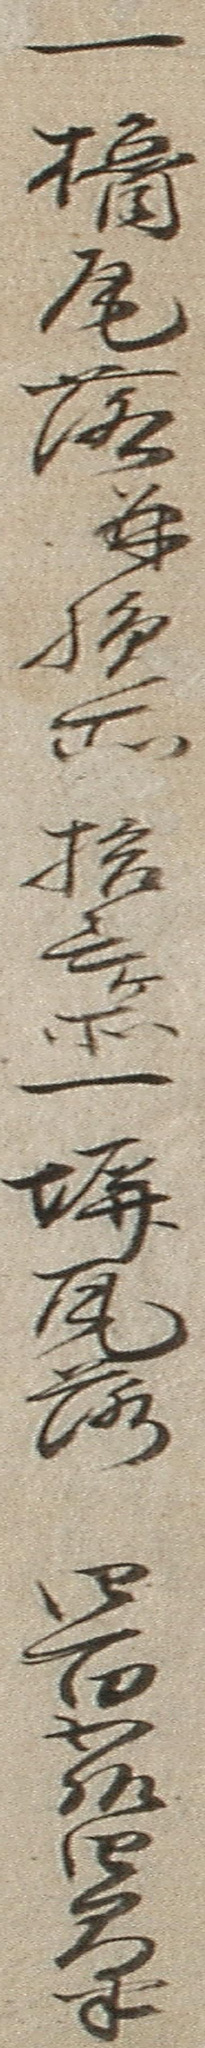一櫓瓦落并損所拾壱ヶ所一塀瓦落四百五拾四間半
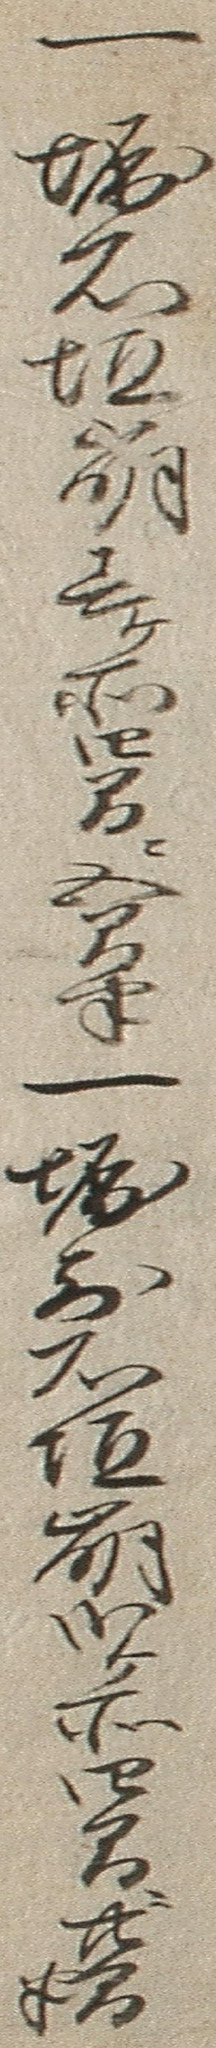一堀石垣崩壱ヶ所四間に五間半一堀前石垣崩弐ヶ所四間に廿間半
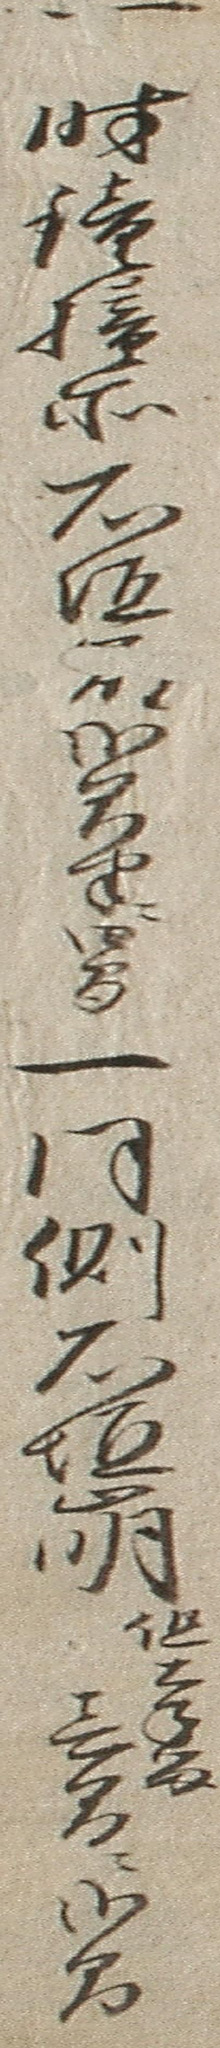一時鐘撞所石垣崩弐間半に四間一同側石垣崩但土手留壱間に弐間

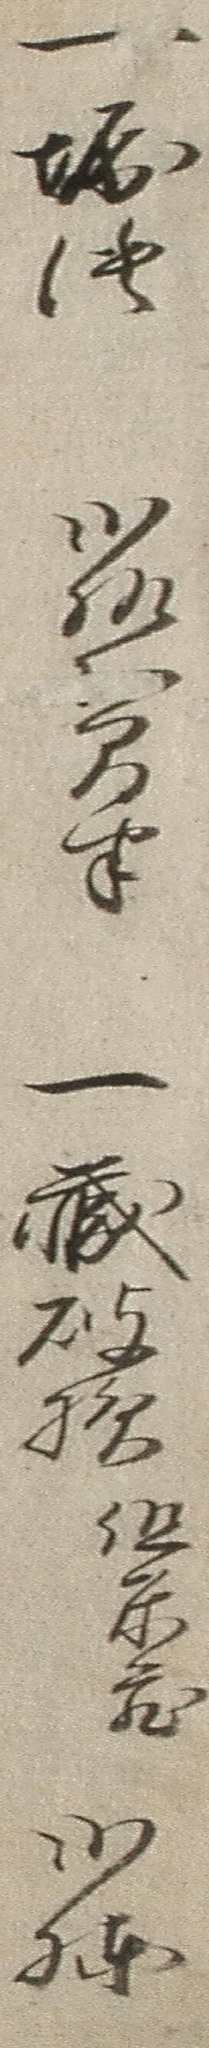一堀潰弐拾五？間半一蔵破損但米蔵弐棟
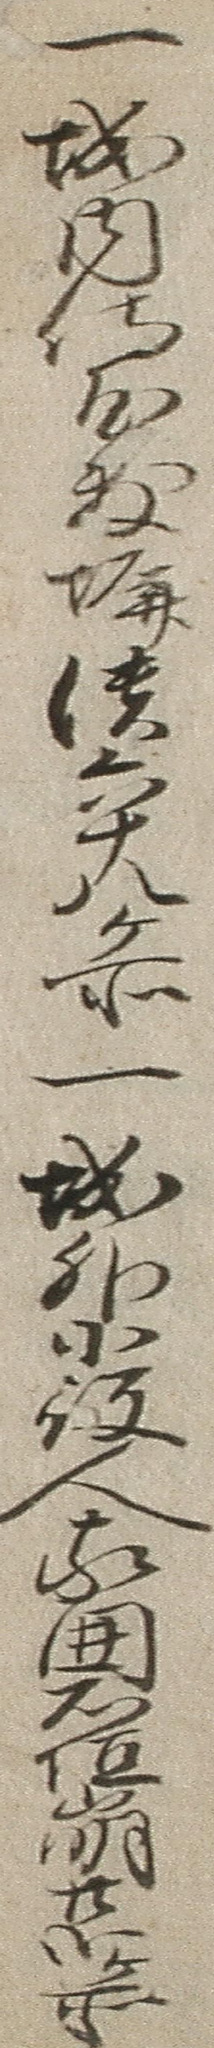一城内侍屋敷塀潰六十八ヶ所一城外小役人家囲石垣崩廿弐ヶ所
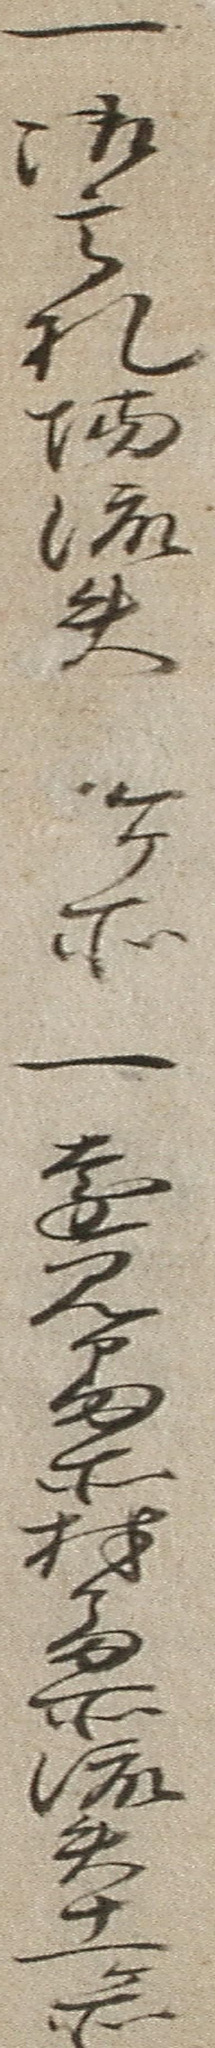一御高札場流失九？ヶ所一遠見番所村番所流失十一ヶ所
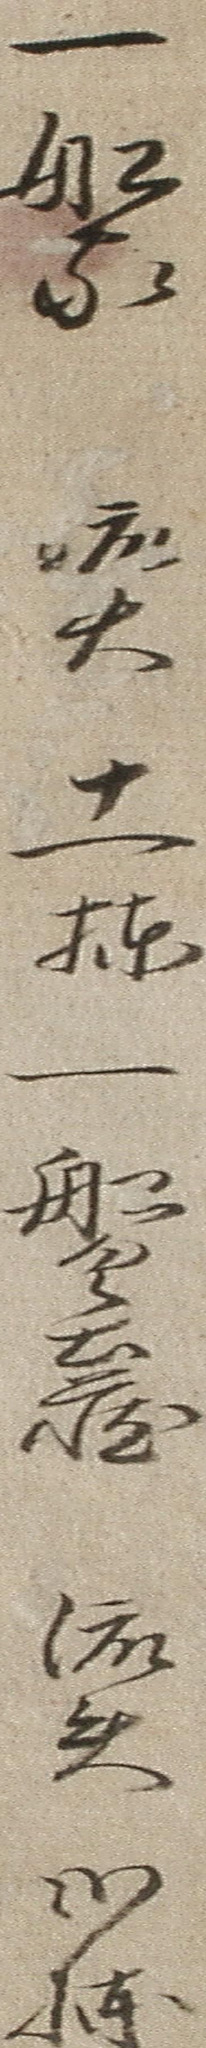一船家流失十一棟一船具土蔵流失弐棟
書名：太平秘録抜書　浅間山燒及普賢山崩
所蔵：東京大学地震研究所図書室 Earthquake Research Institute Library, The University of Tokyo, JAPAN
